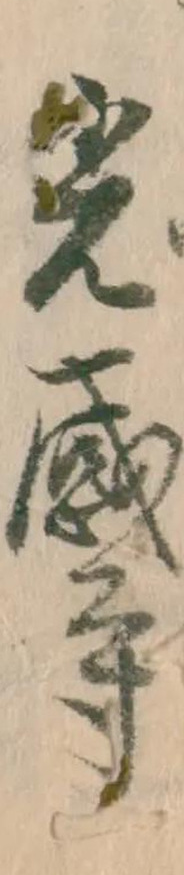光感寺

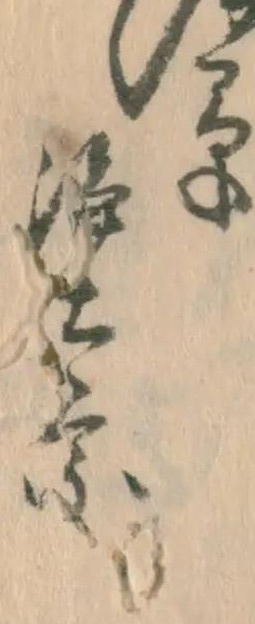浄土宗
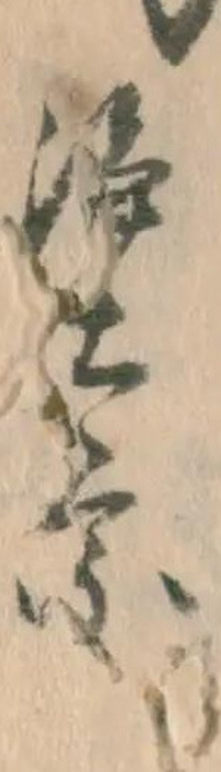浄土宗
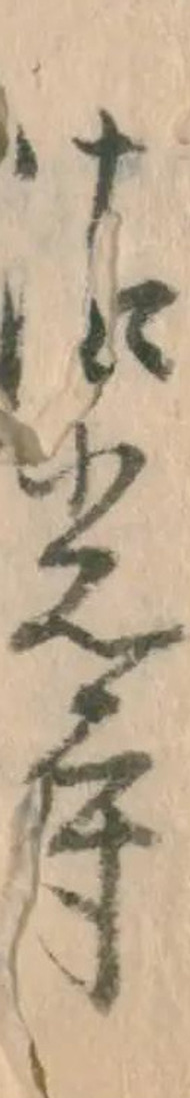清光寺
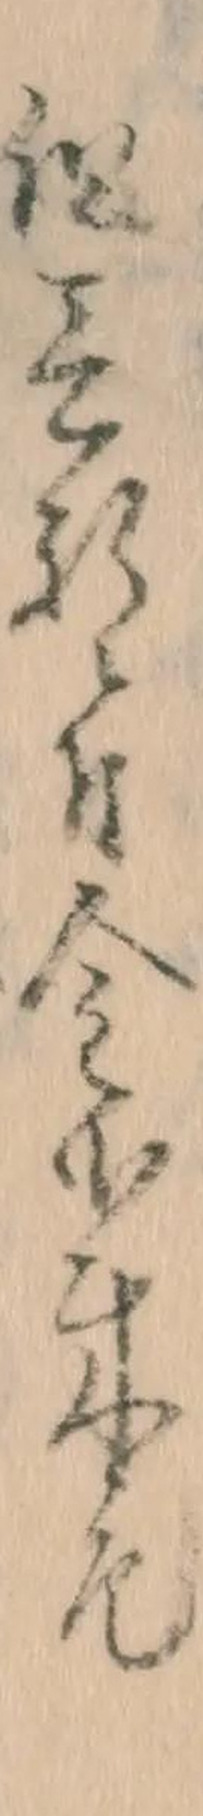但壱軒ニ付金壱朱宛
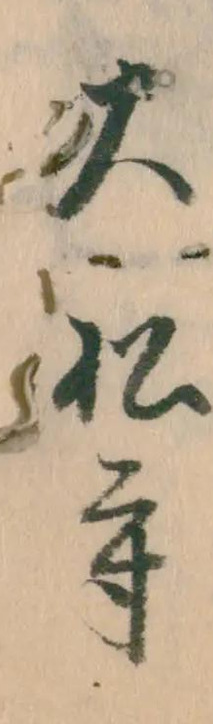大松寺
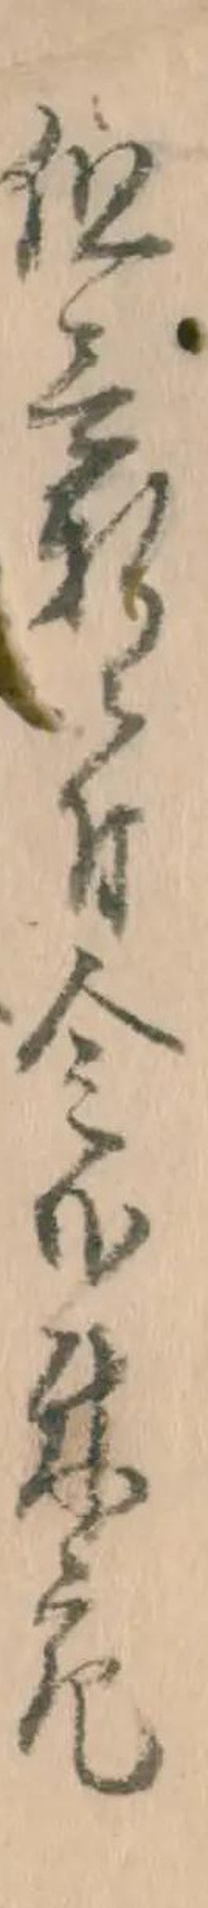但壱軒ニ付金壱朱宛
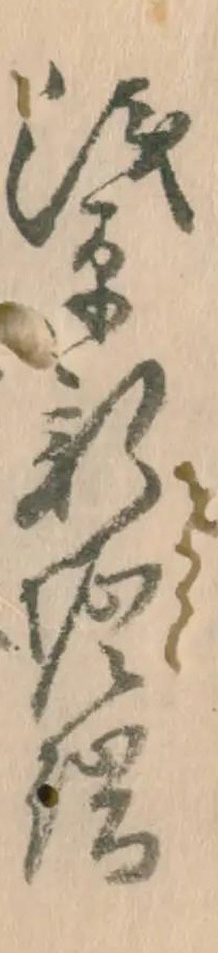浅草新堀端
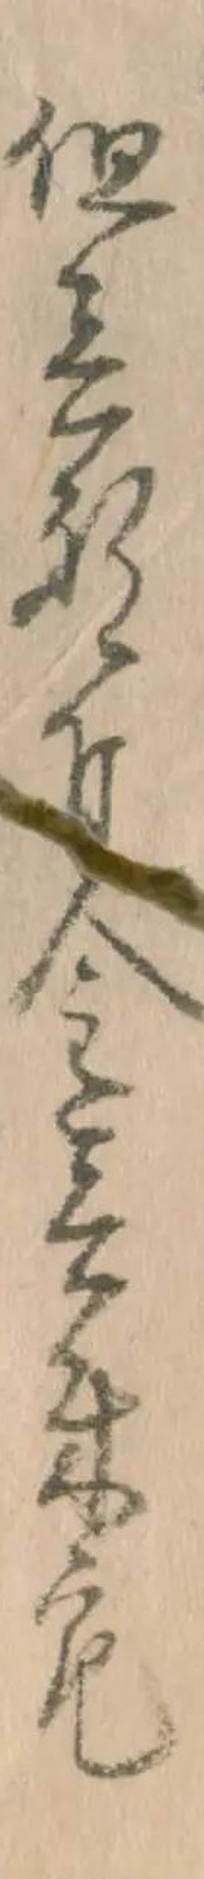但壱軒ニ付金壱朱宛
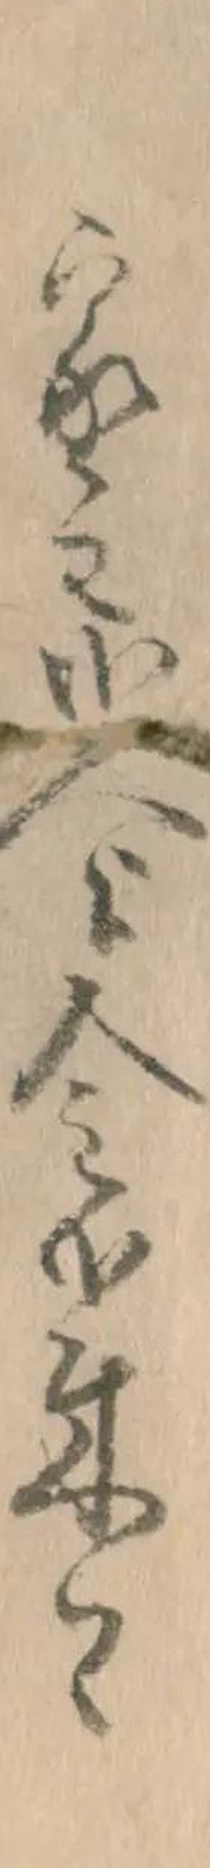家主弐人え金弐朱ツヽ

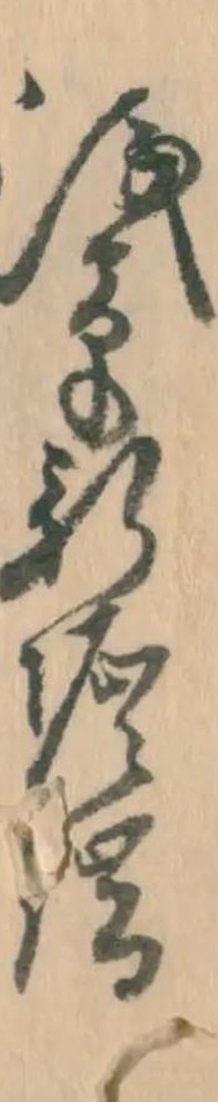浅草新堀端
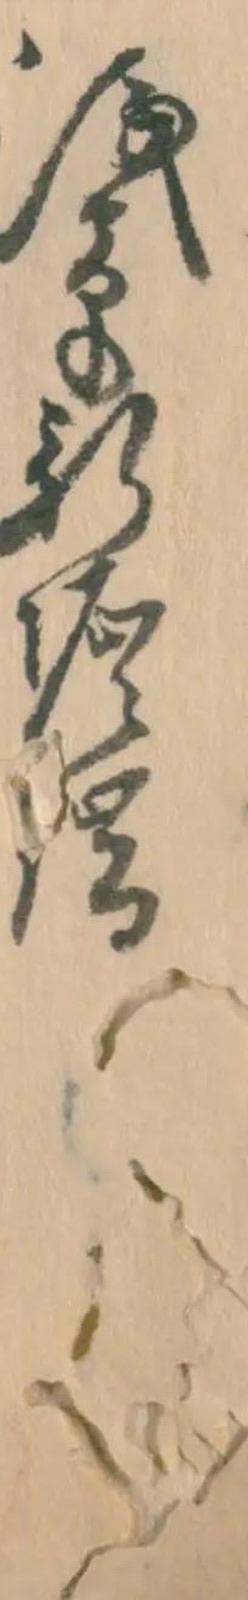浅草新堀端
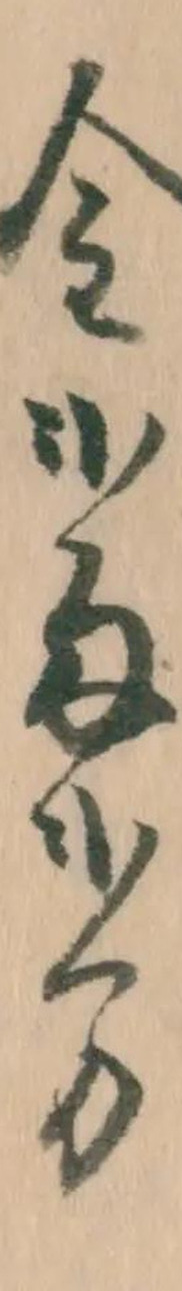金弐両弐分
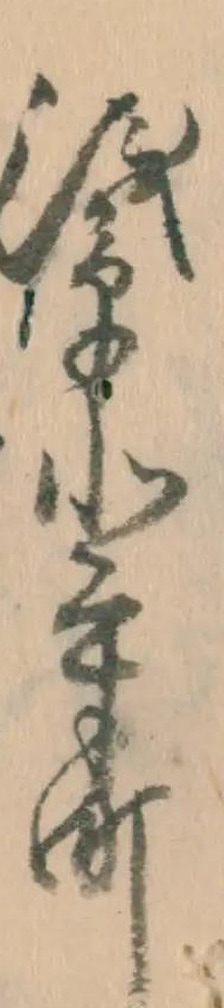浅草北寺町
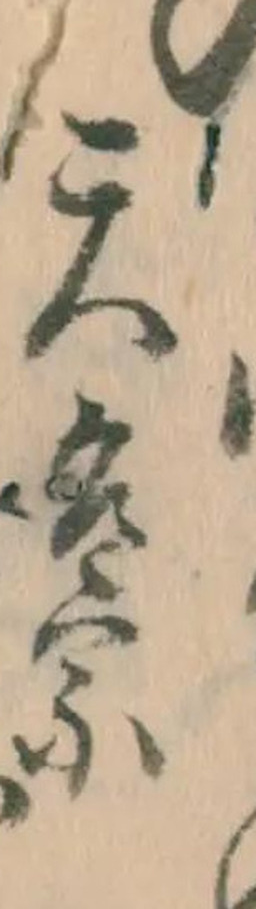天台宗
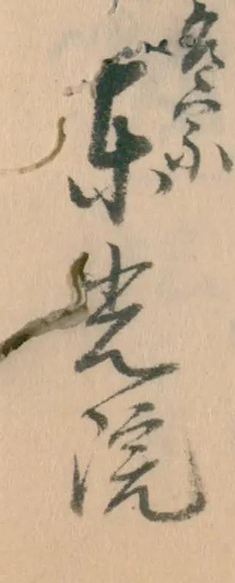東光院
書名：武家方并寺院等ニテ施差出候一件
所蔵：国立国会図書館 National Diet Library, JAPAN
